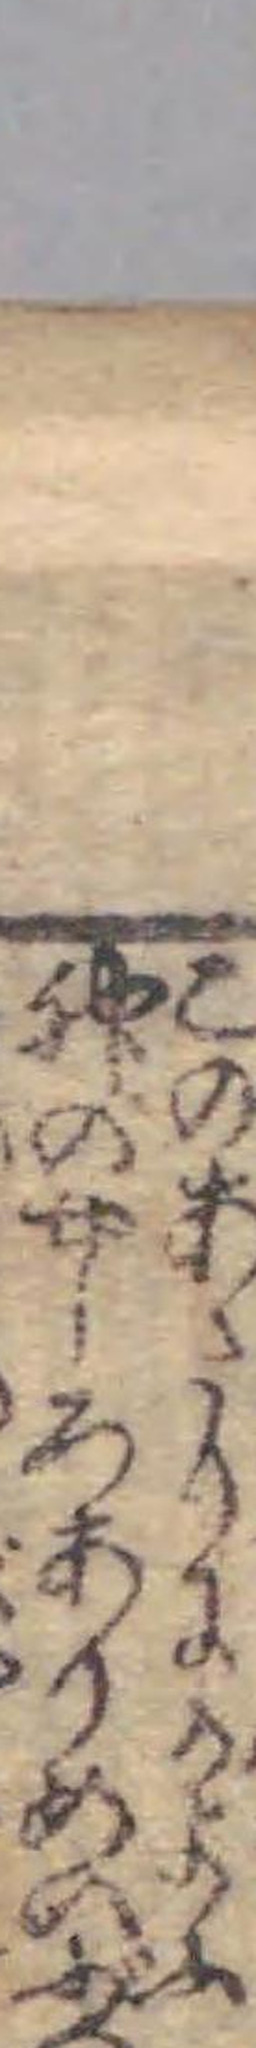神のやしろありめいぶつ
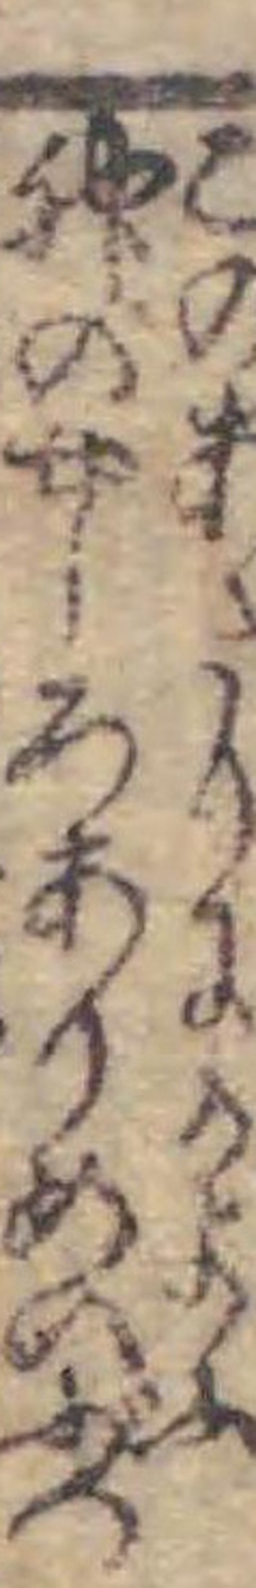神のやしろありめいぶつ
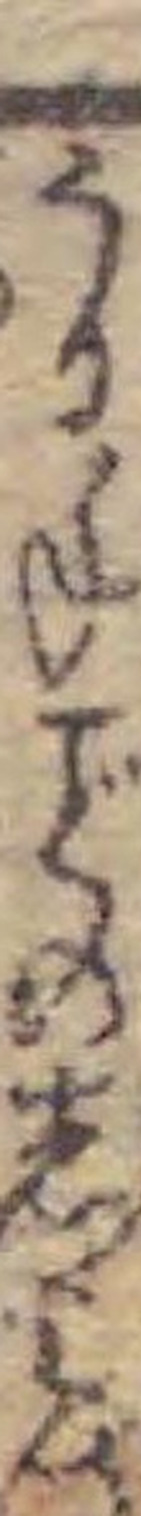うる手ごとのしみづ
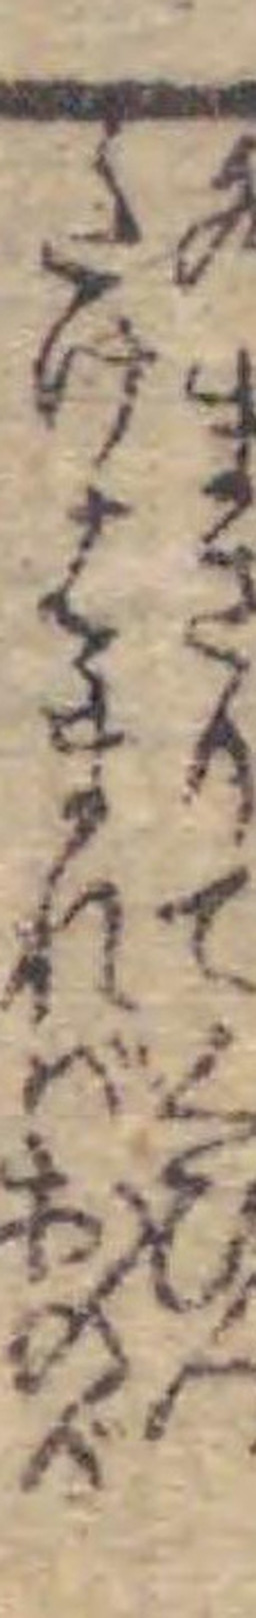たけはまればおのが
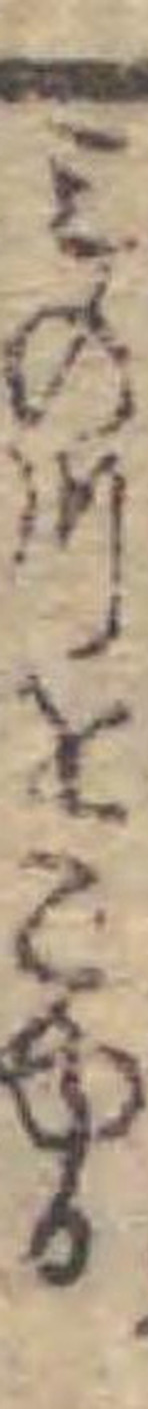みの川をこゆる
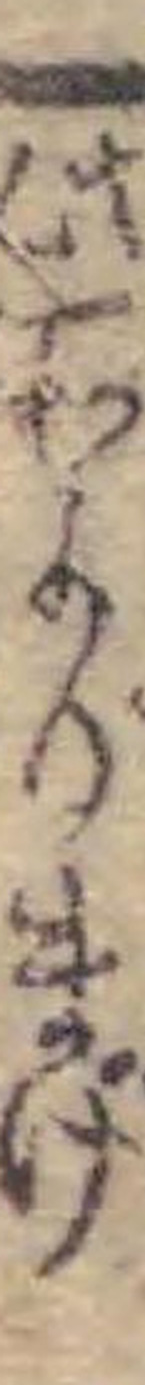此所よりまげ
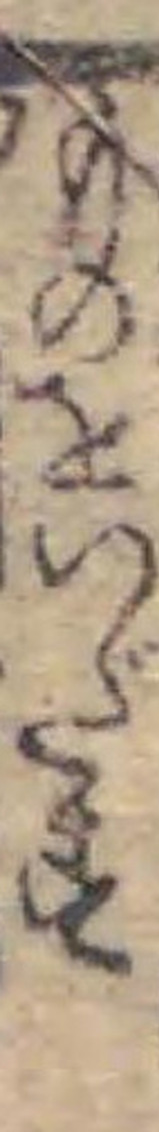ものをいだす
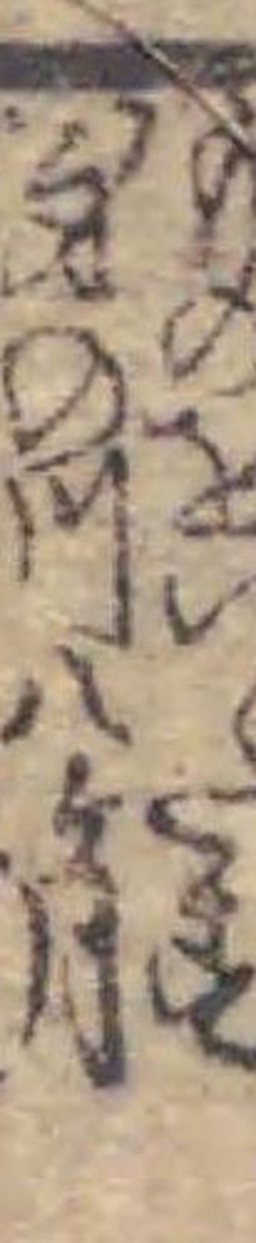身の川八ヶ月
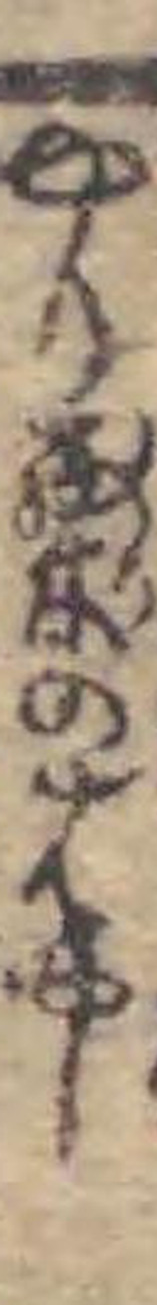やり栗のはやし
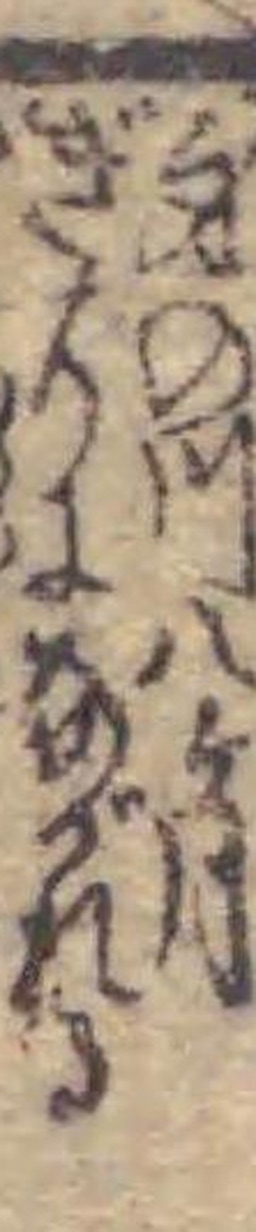ぎりにながれる
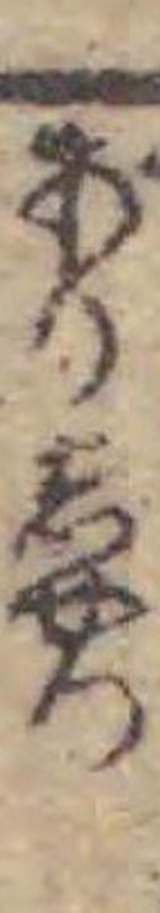ありしやつ
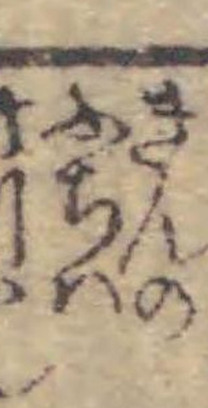ふちは
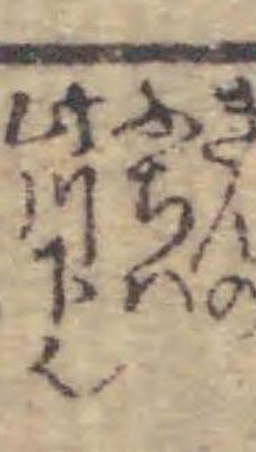此川下也
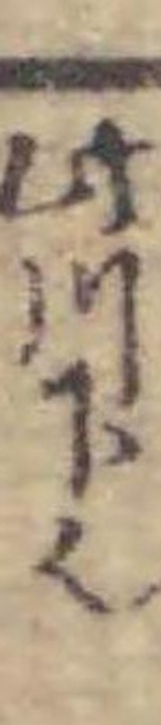此川下也
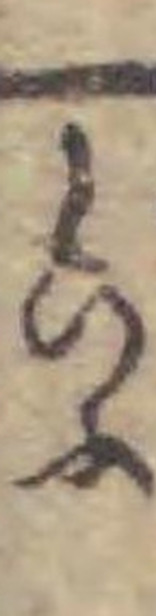といふ
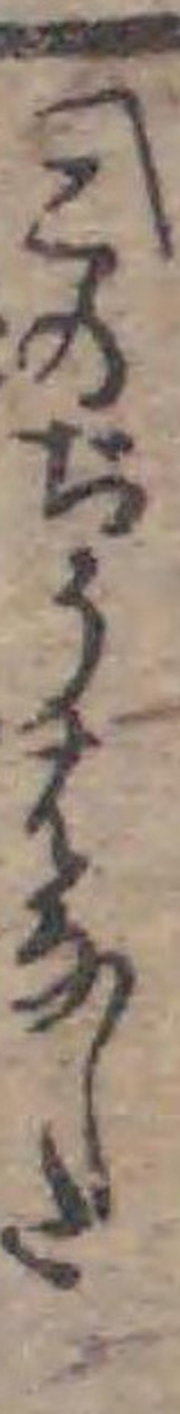〽このぢうはなした
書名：北国順礼唄方便 : 3巻
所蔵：国立国会図書館 National Diet Library, JAPAN
